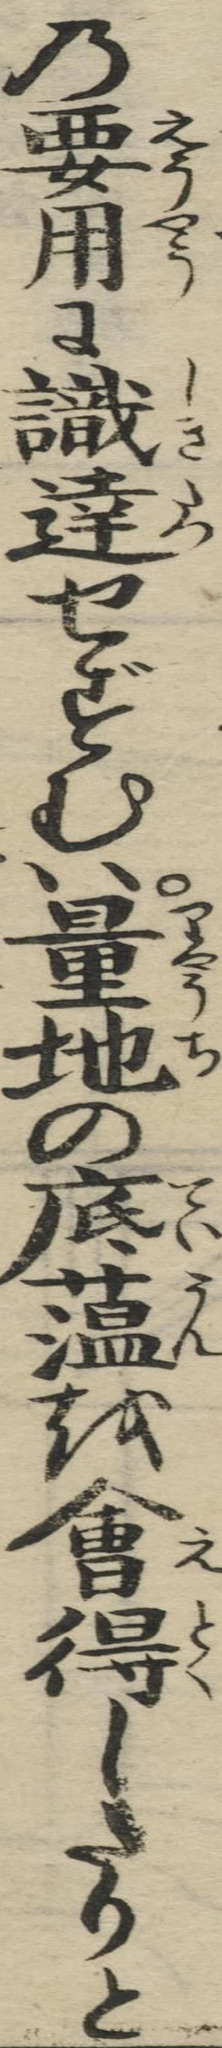の要用に識達せずむは。量地の底薀を会得したりと
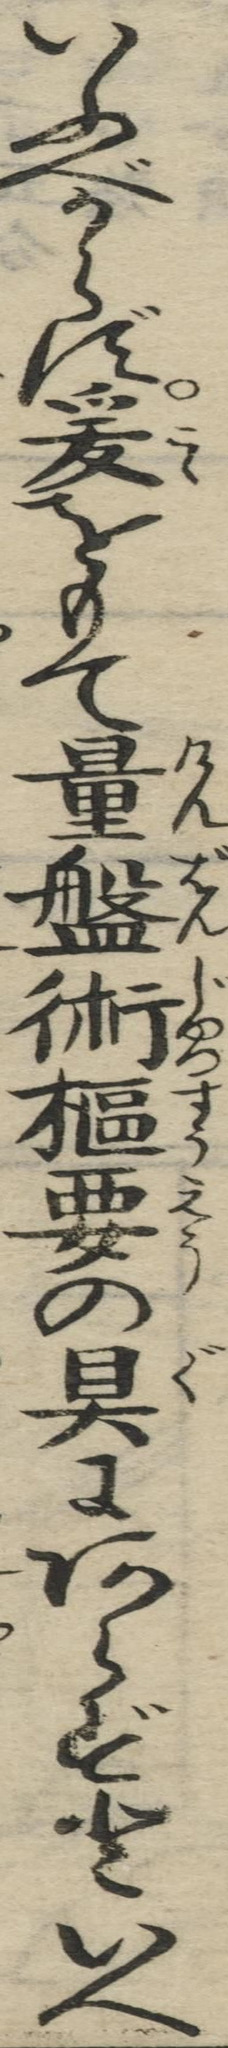いふべからず。爰をもて量盤術枢要の具にあらずといへ
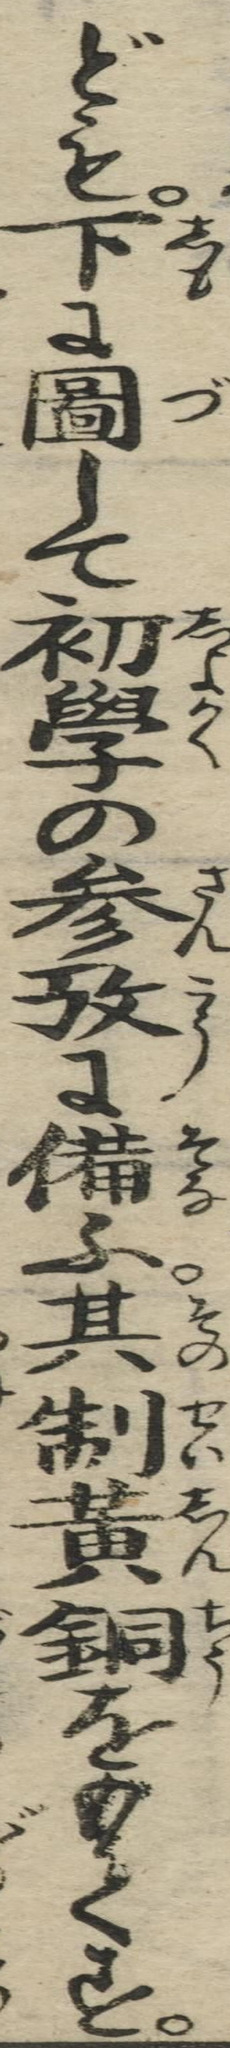ども。下に図して初学の参考に備ふ。其制黃銅をもてす。
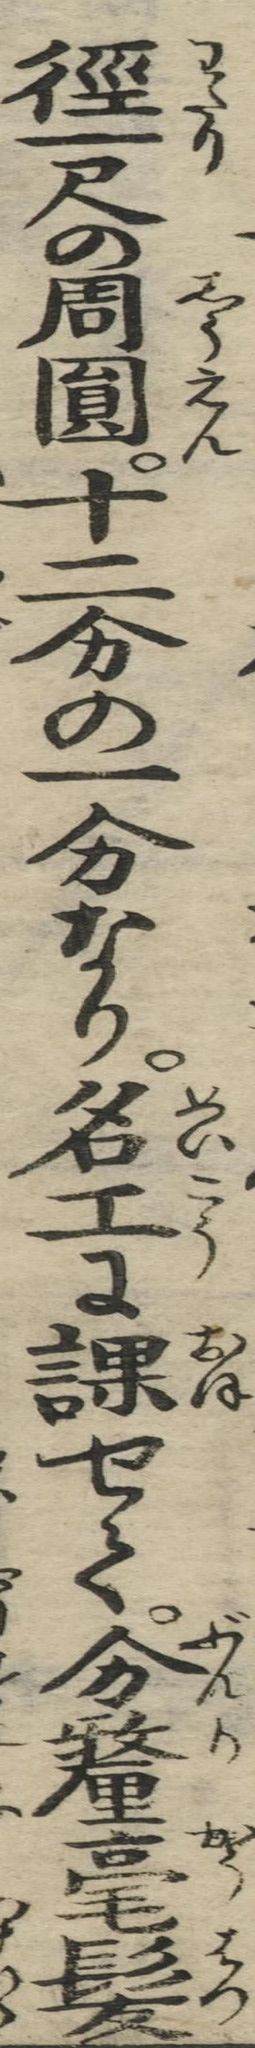経一尺の周円。十二分の一分なり。名工に課せて。分釐毫髪
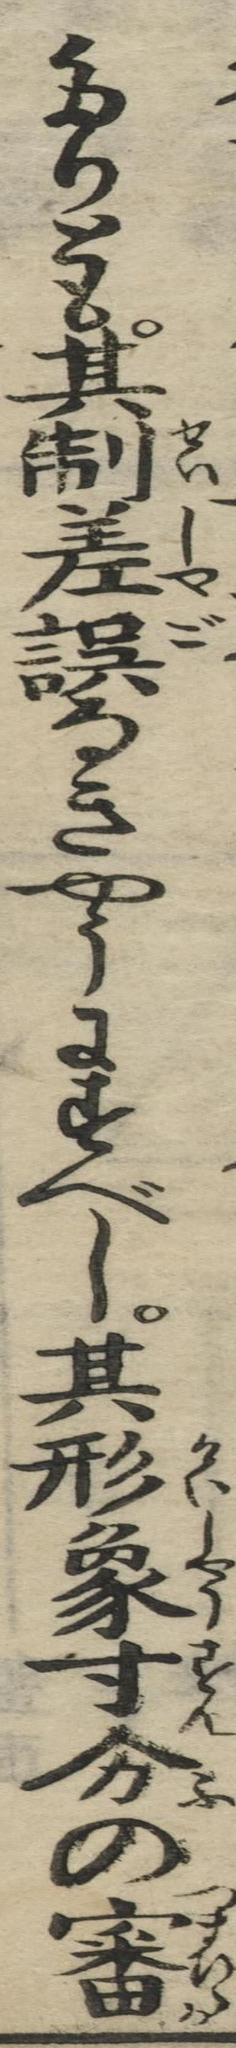たりとも。其制差誤なきやうにすべし。其形象寸分の審
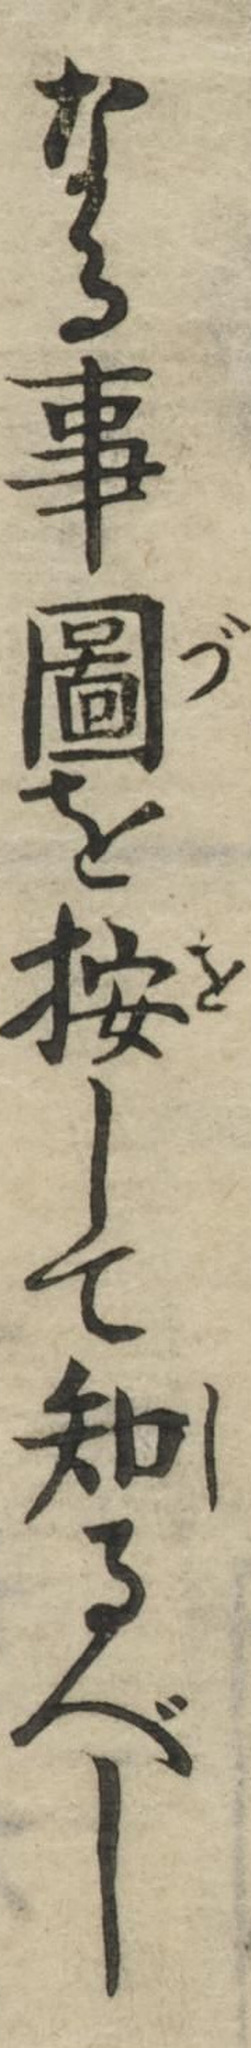なる事図を按して知るべし

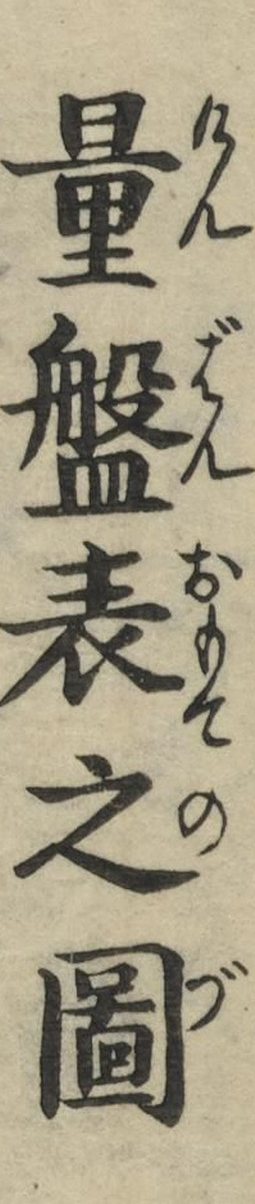量盤表之図
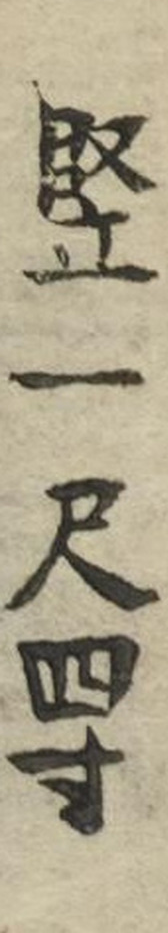竪一尺四寸
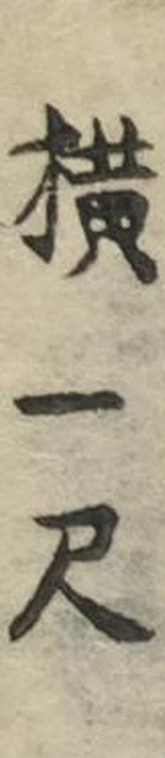横一尺
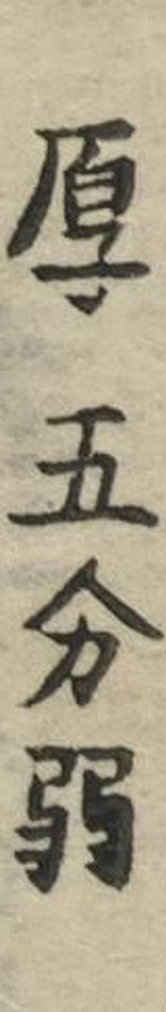厚五分弱
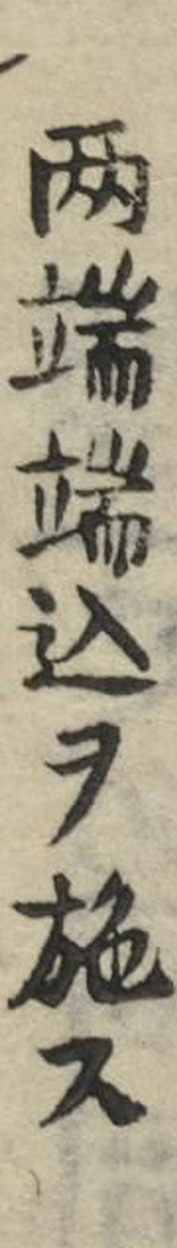両端端込ヲ施ス
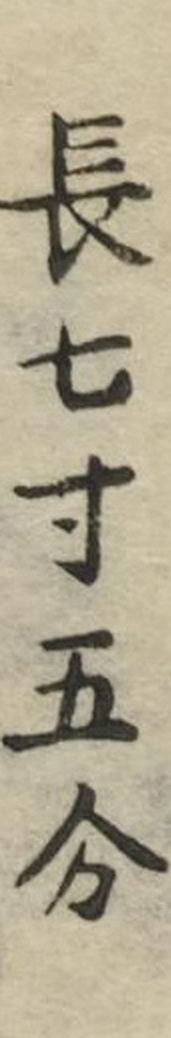長七寸五分
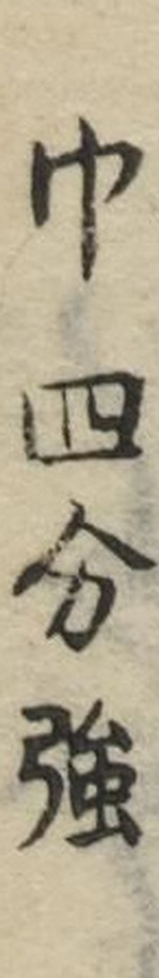巾四分強
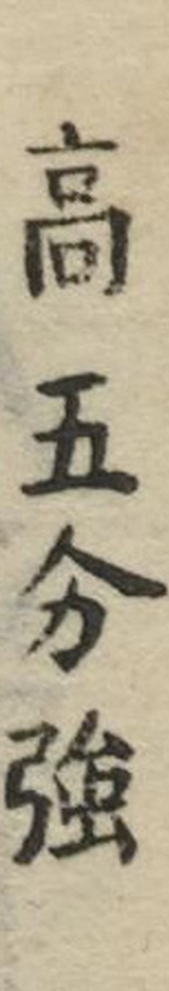高五分強
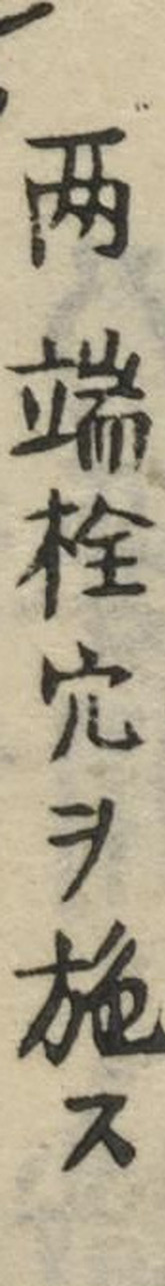両端栓穴ヲ施ス
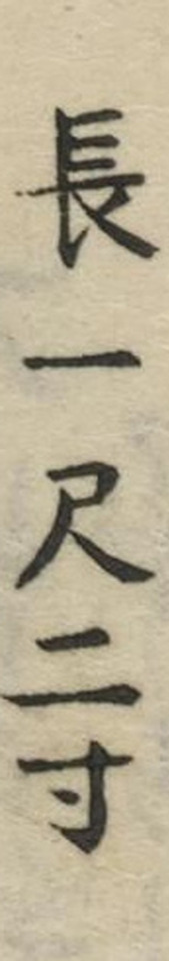長一尺二寸
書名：量地指南　巻之一（内題）
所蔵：東京大学地震研究所図書室 Earthquake Research Institute Library, The University of Tokyo, JAPAN
